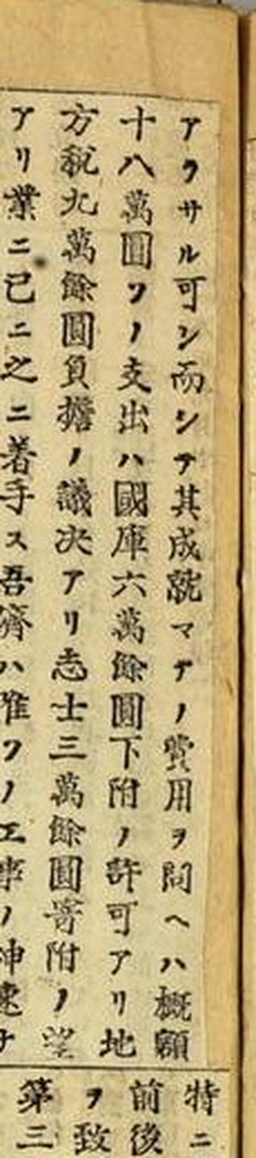十八萬圓ソノ支出ハ國庫六萬餘圓下附ノ許可アリ地
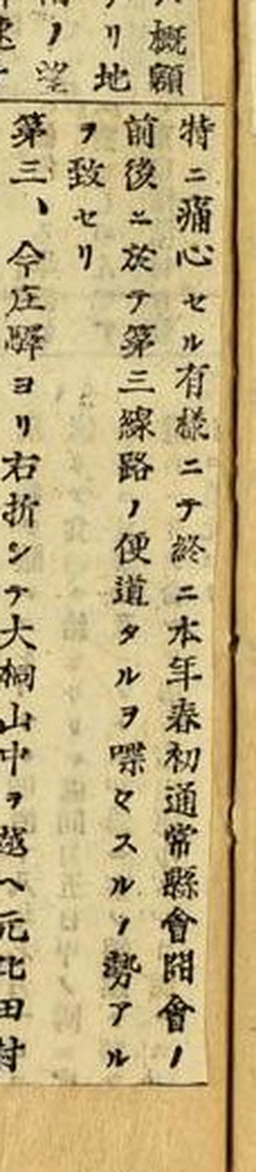前後ニ於テ第三線路ノ便道タルヲ噤々スルノ勢アル
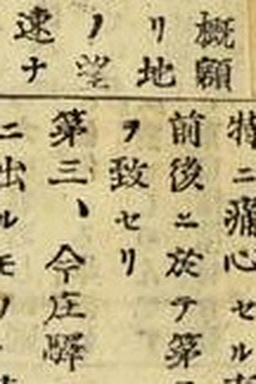ヲ致セリ
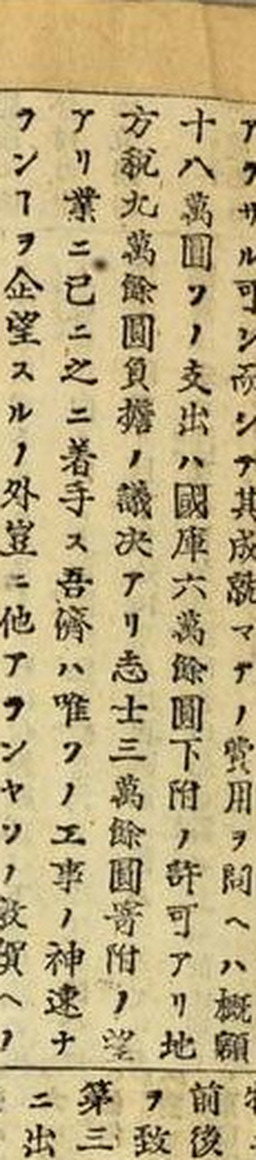方税九萬餘圓負擔ノ議決アリ志士三萬餘圓寄附ノ望
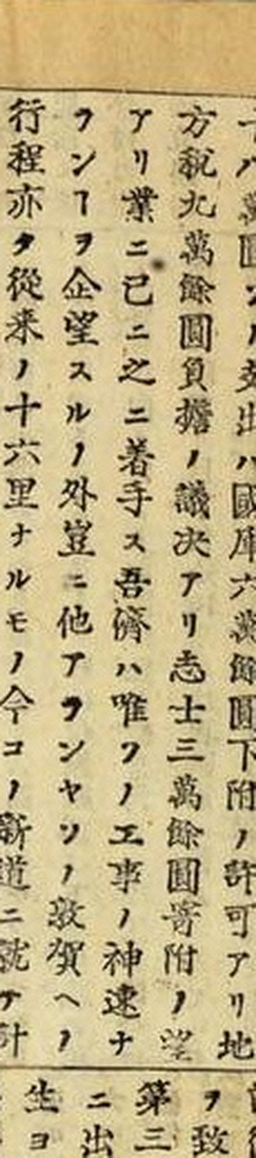アリ業ニ已ニ之ニ着手ス吾儕ハ唯ソノ工事ノ神速ナ
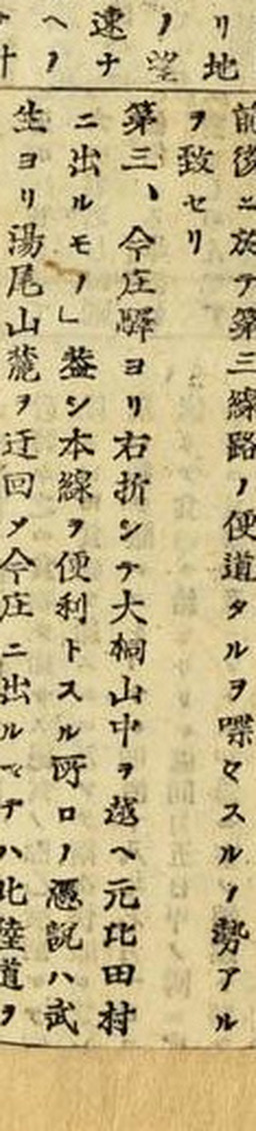第三、今庄驛ヨリ右折シテ大桐山中ヲ越へ元比田村
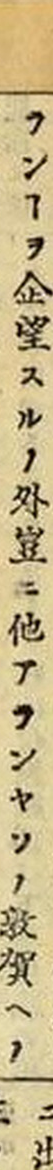ランヿヲ企望スルノ外豈ニ他アランヤソノ敦賀ヘノ
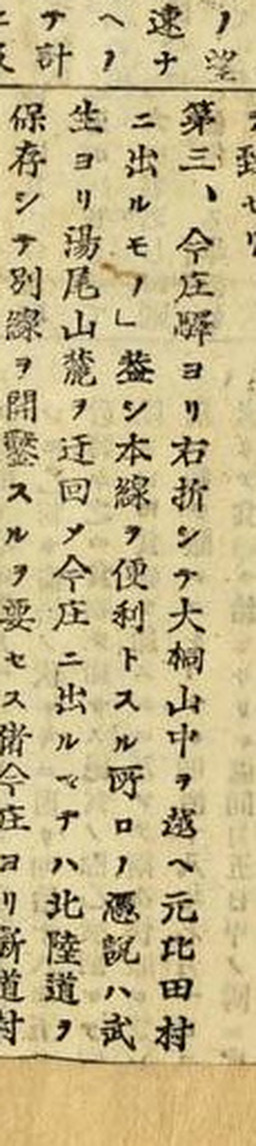ニ出ルモノ」蓋シ本線ヲ便利トスル所ロノ惡説ハ武
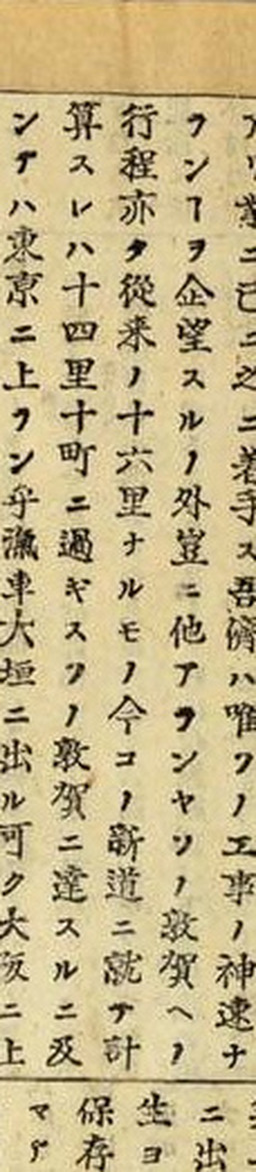行程亦タ從来ノ十六里ナルモノ今コノ新道ニ就テ計
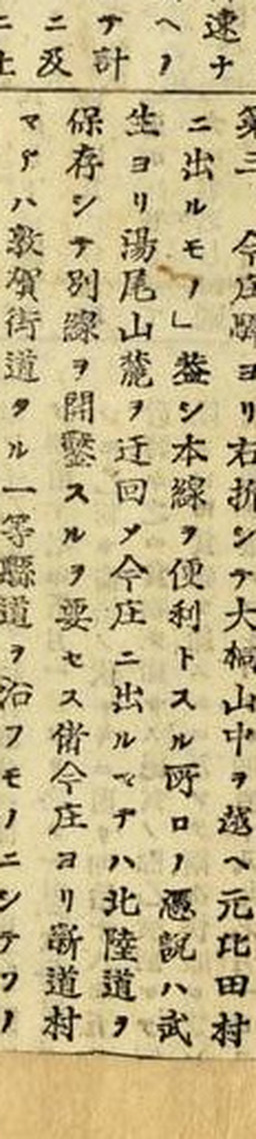生ヨリ湯尾山麓ヲ迂回乄今庄ニ出ルマデハ北陸道ヲ
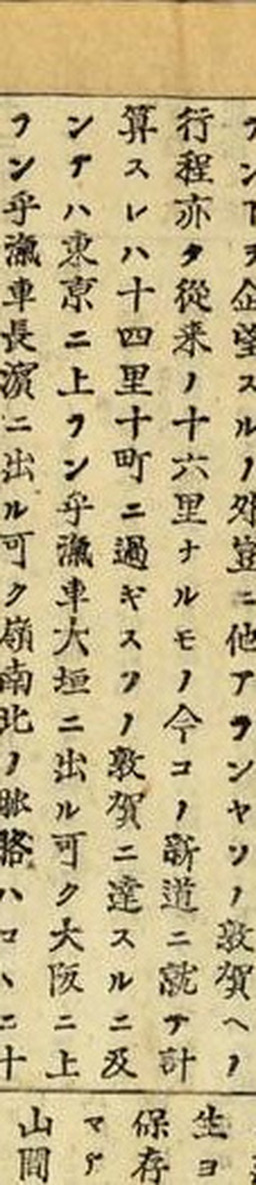算スレハ十四里十町ニ過ギスソノ敦賀ニ達スルニ及
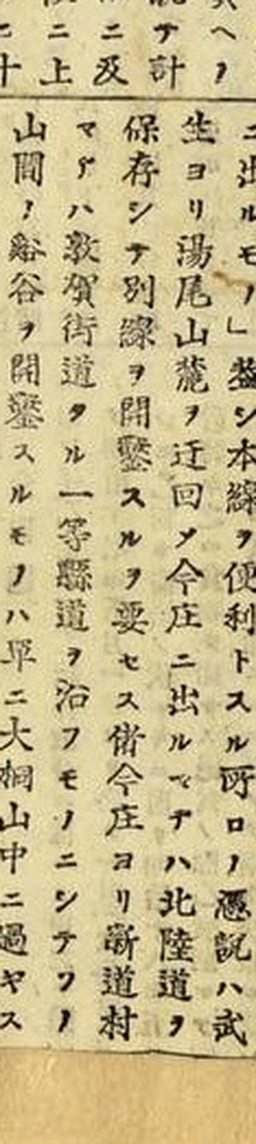保存シテ別線ヲ開鑿スルヲ要セス偖今庄ヨリ新道村
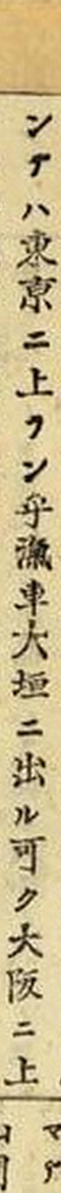ンデハ東亰ニ上ラン乎滊車大垣ニ出ル可ク大阪ニ上
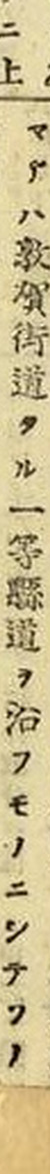マテハ敦賀街道タル一等縣道ヲ沿フモノニシテソノ
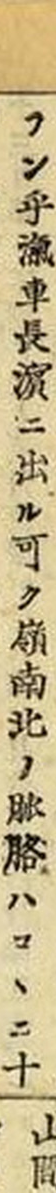ラン乎滊車長濱ニ出ル可ク嶺南北ノ脈胳ハコヽニ十
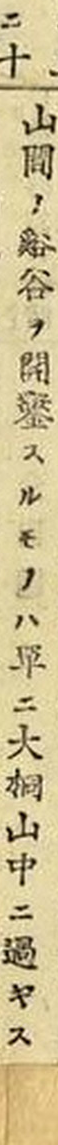山間ノ谿谷ヲ開鑿スルモノハ單ニ大桐山中ニ過ギス
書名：温古集 五巻
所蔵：福井県文書館 Fukui Prefectural Archives
